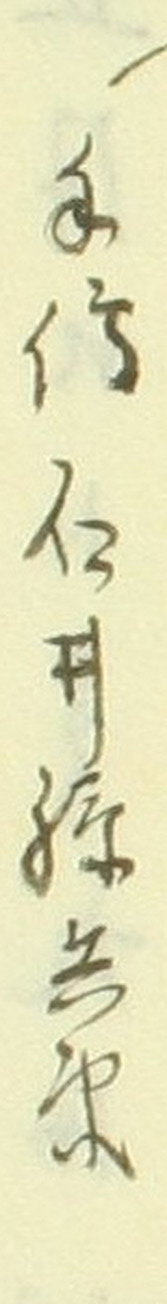手伝石井弥兵衛
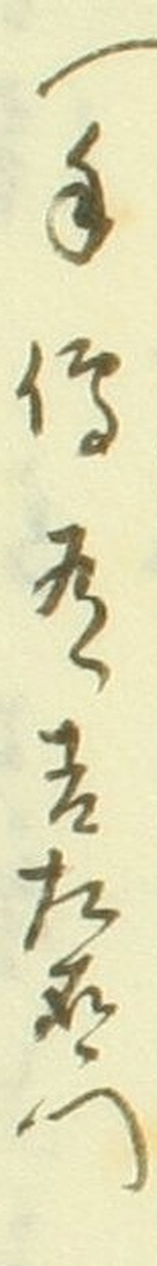手伝有吉吉左衛門
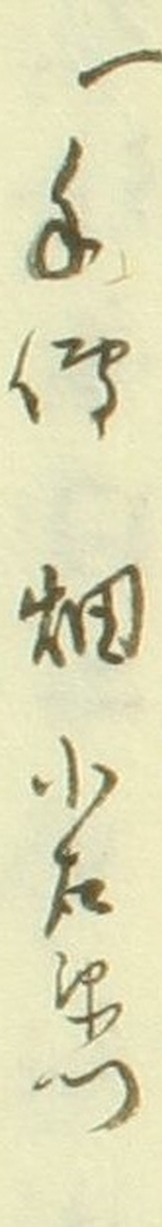手伝畑小右衛門
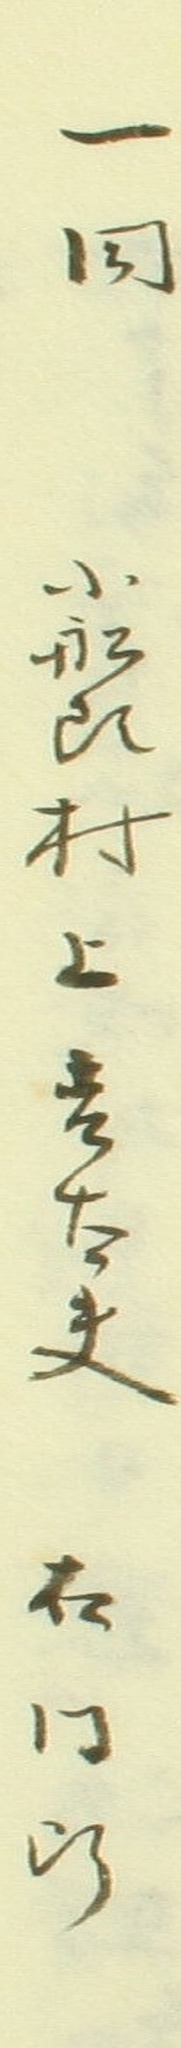一同小船頭村上吉太夫右同断
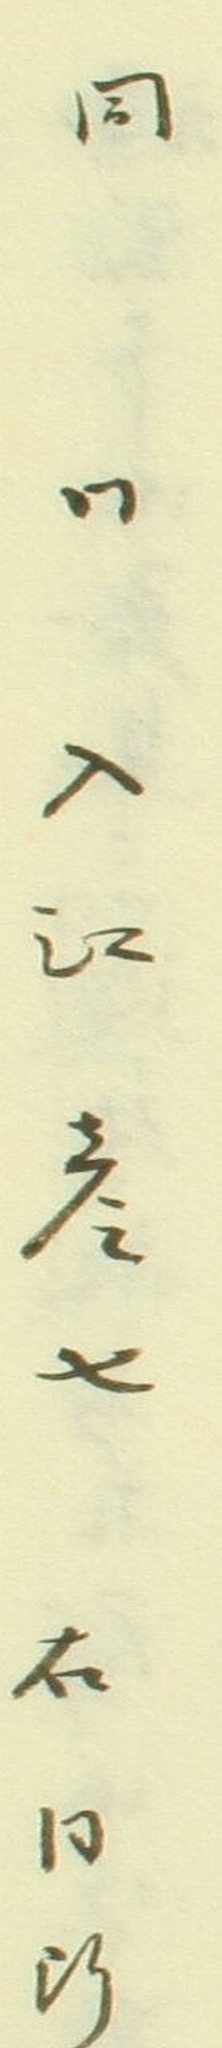一同同入江彦七右同断
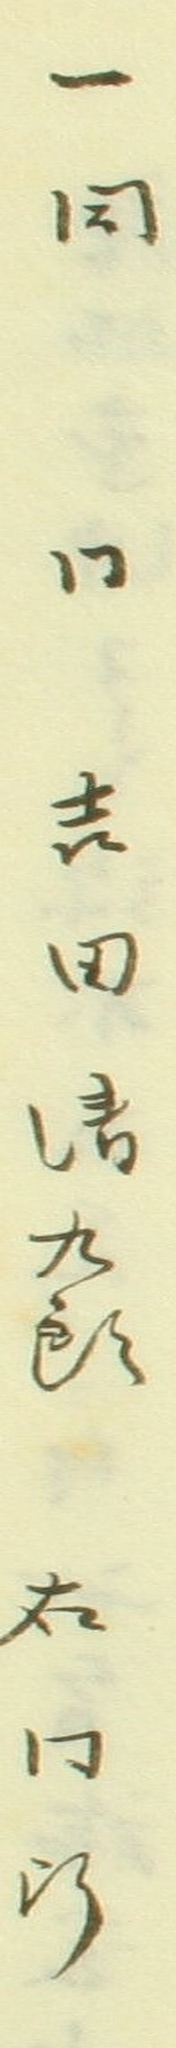一同同吉田清九朗右同断
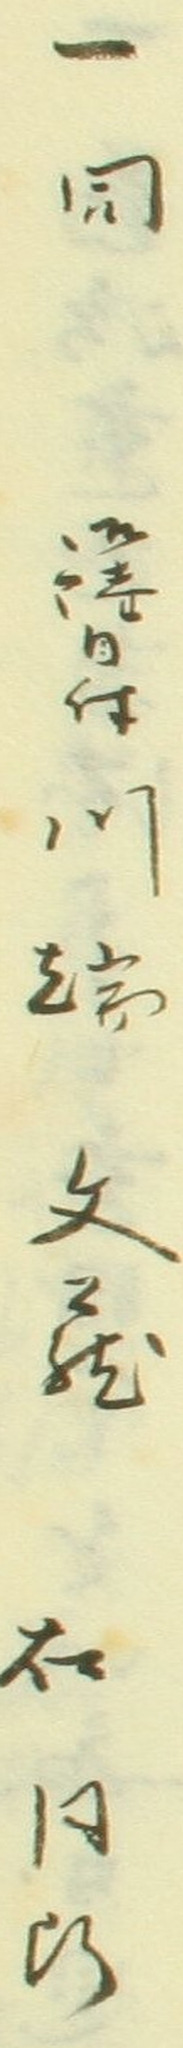一同御徒目付川端文蔵右同断
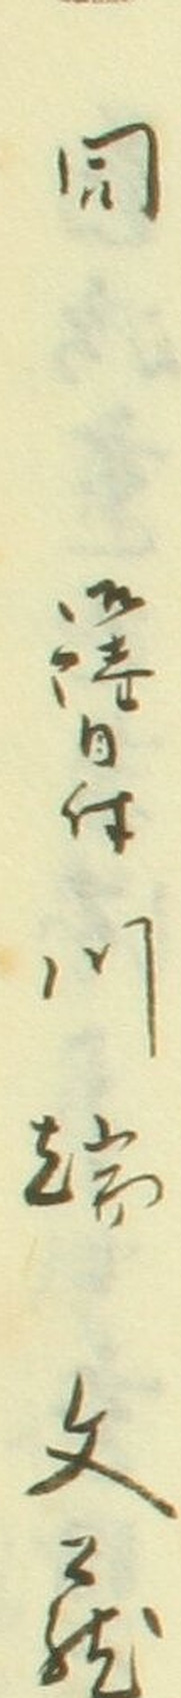御徒目付川端文蔵
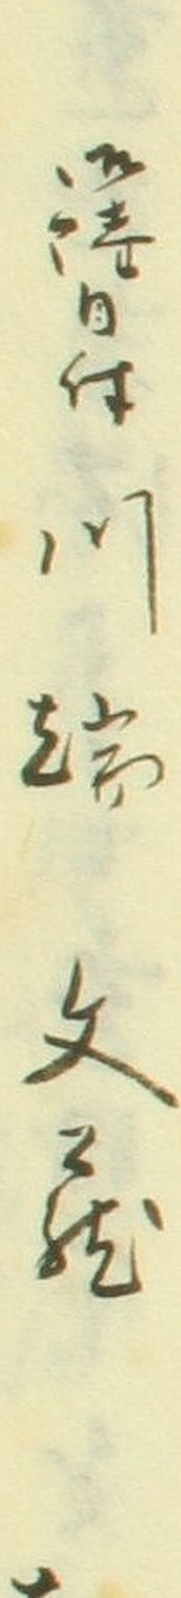御徒目付川端文蔵

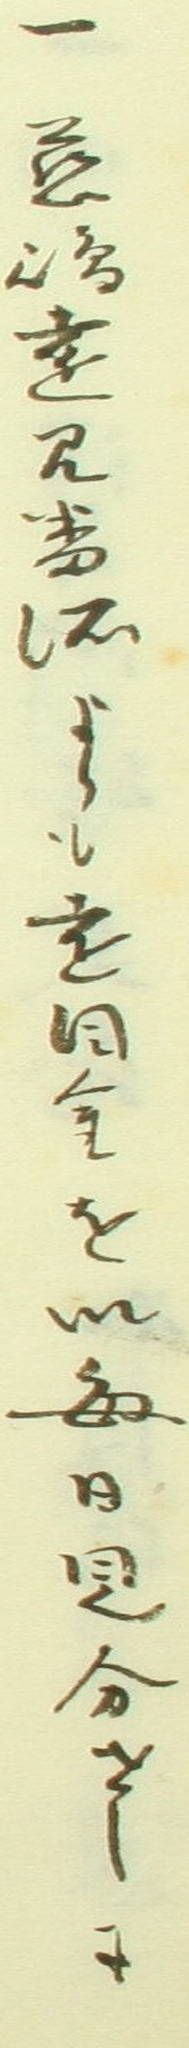一慈嶋遠見番所よりも遠目金を以毎日見分せしに
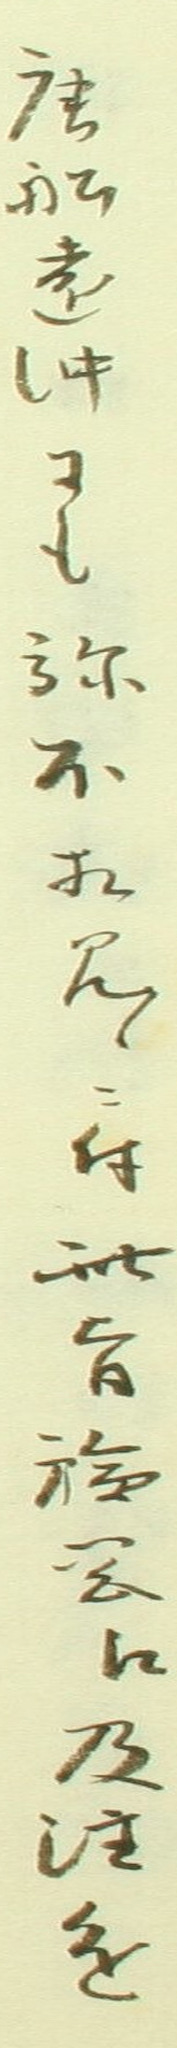唐船遠沖にも弥不相見候に付此旨福岡江及注進
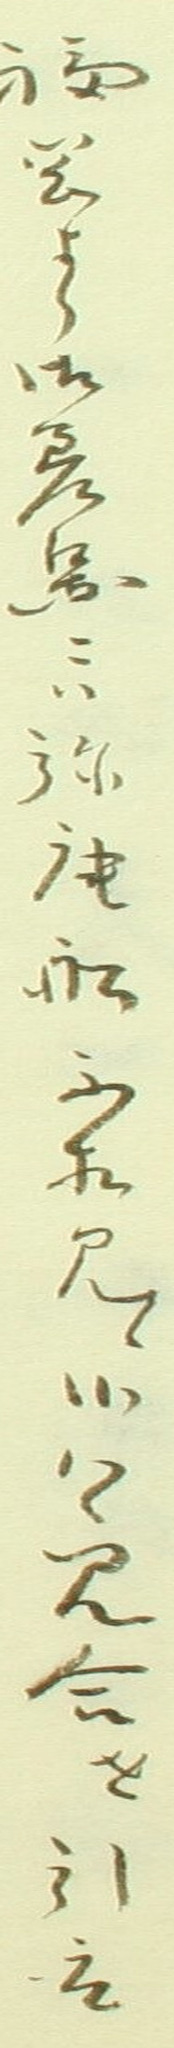福岡より御差図には弥唐船不相見へ候はは見合を引取
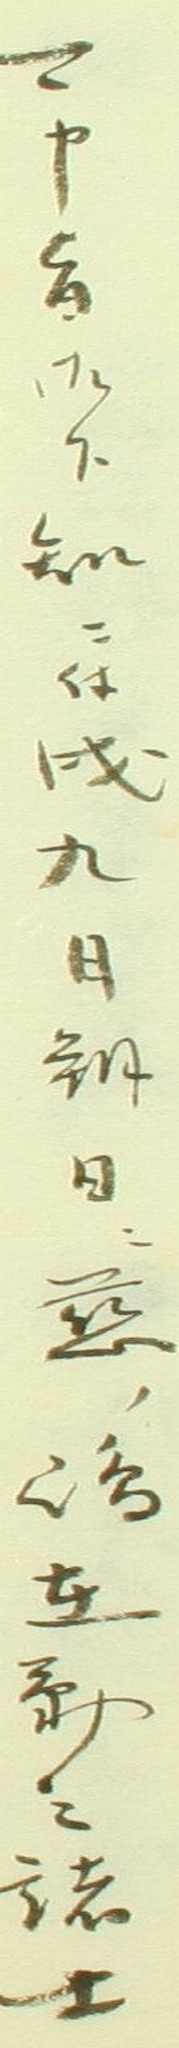可申旨御下知に付戌九月朔日に慈の嶋在勤の諸士
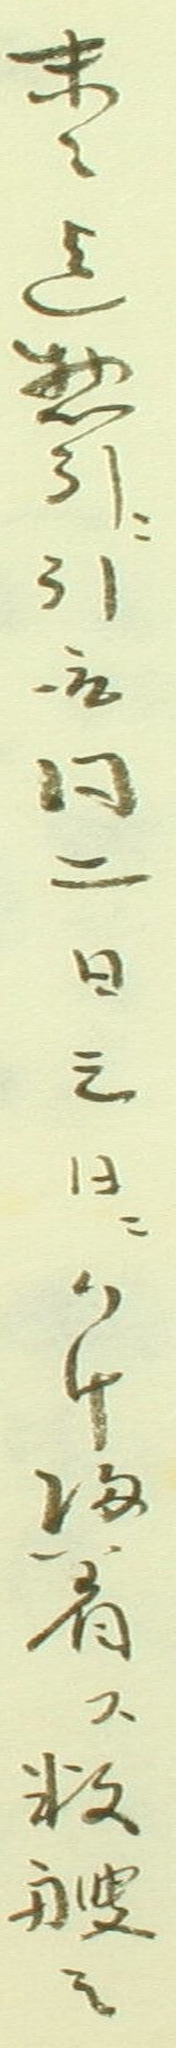末末迠惣引に引取同二日三日にかけ帰着す数艘之
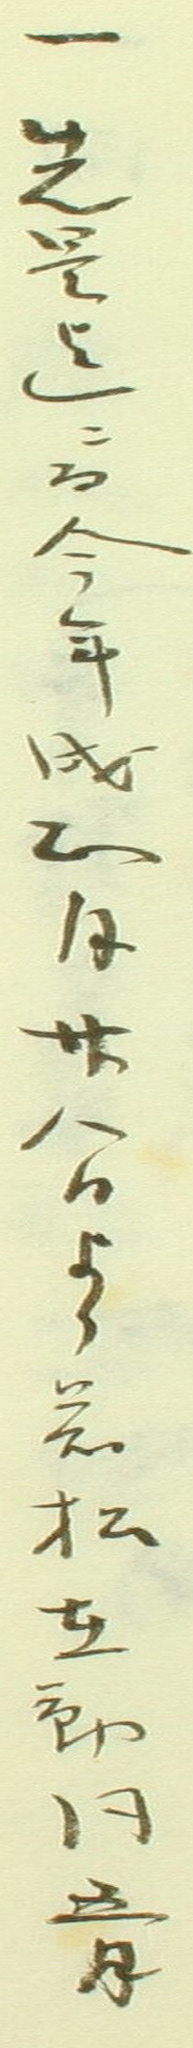一先是迄に而今年戌正月廿八日より若松在勤同五月
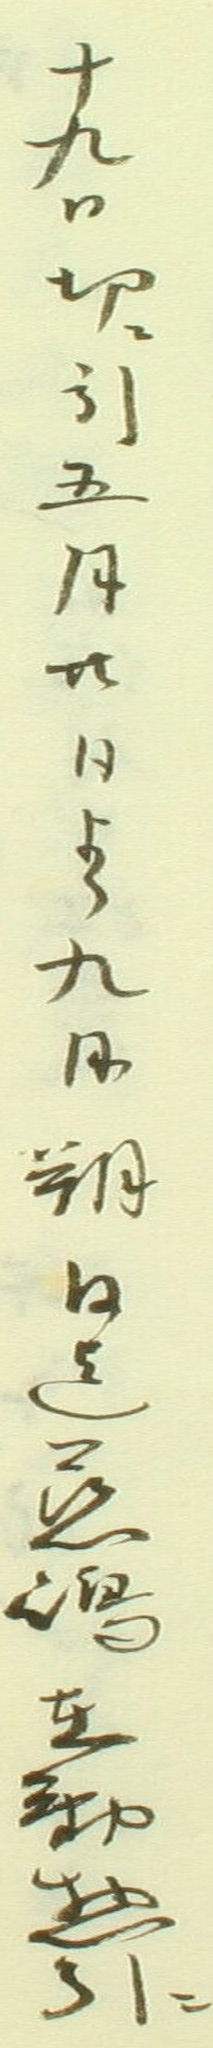十九日切に引五月廿日より九月朔日迠慈嶋在勤惣引に
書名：唐船漂流記 三
